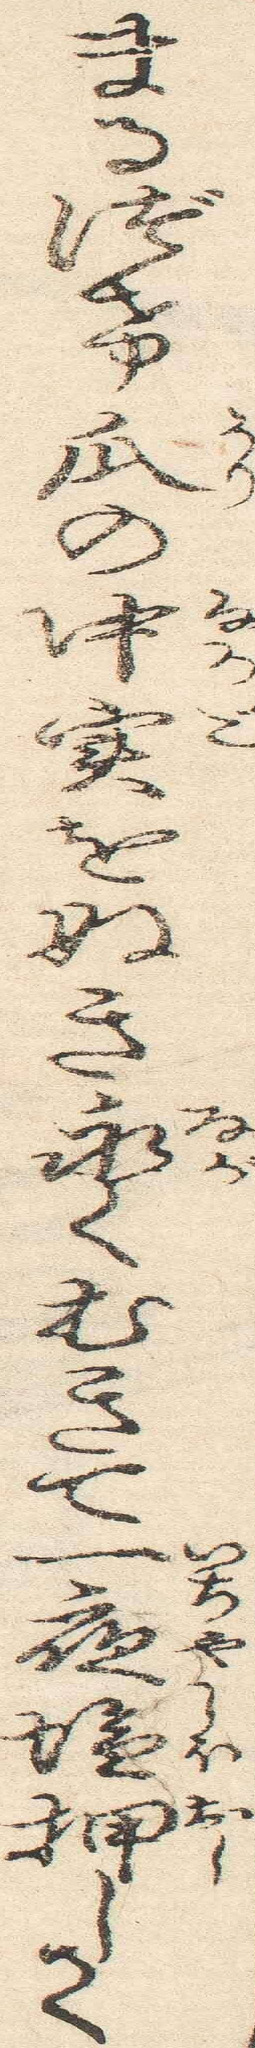まるづけ瓜の中実をぬき永くむきて一夜塩押して
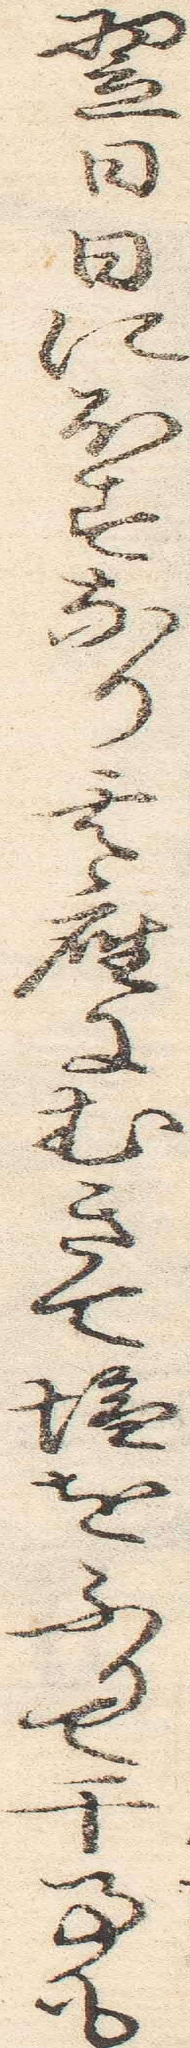翌日日にほすなり其座にむきて塩をふりて干事も
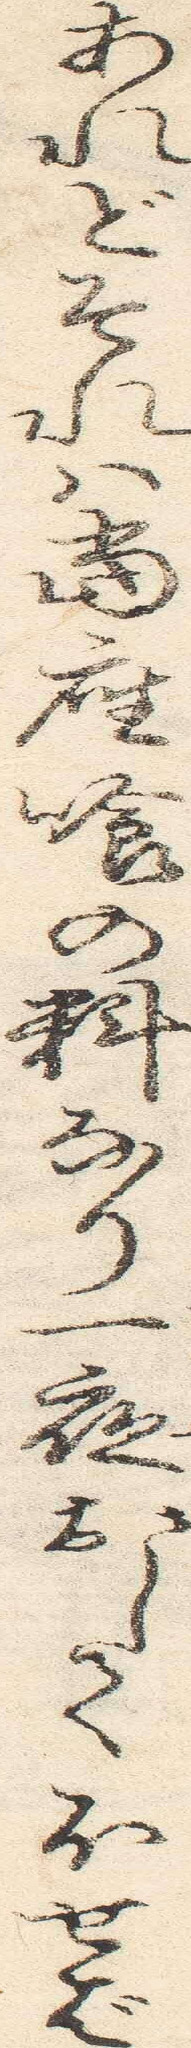あれどそれは当座喰の料なり一夜おしてほせば
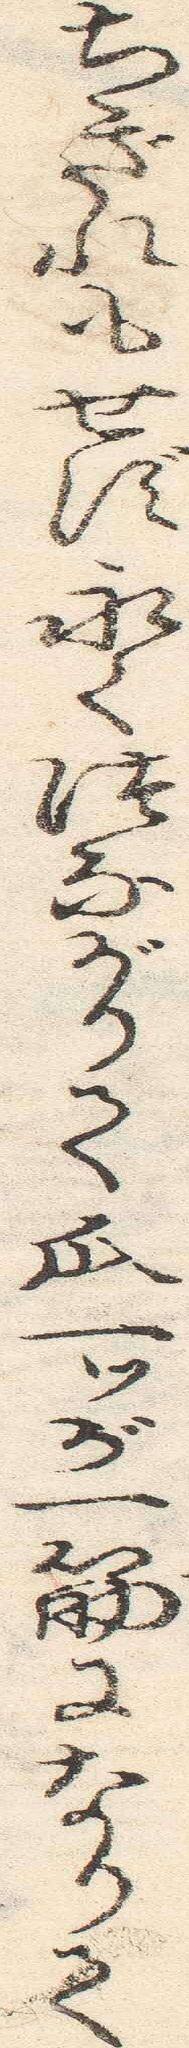ちぎれもせず永くつながりて瓜一ッが一筋になりて
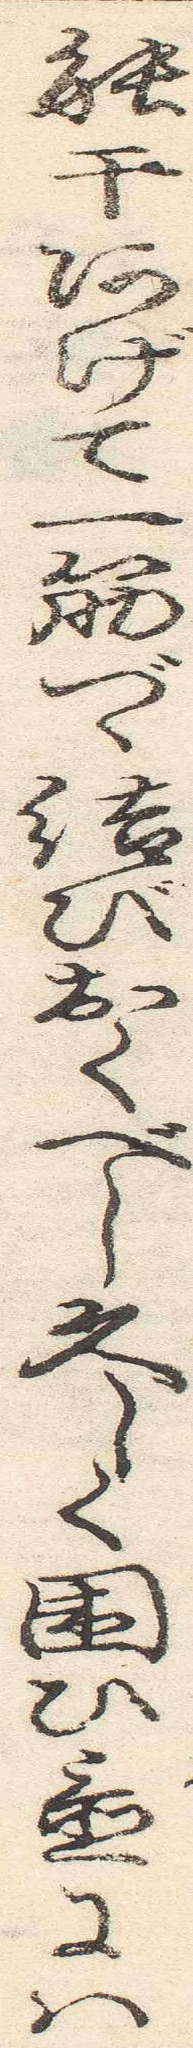能干あげて一筋づゝ結びおくべし久しく囲ひ置には
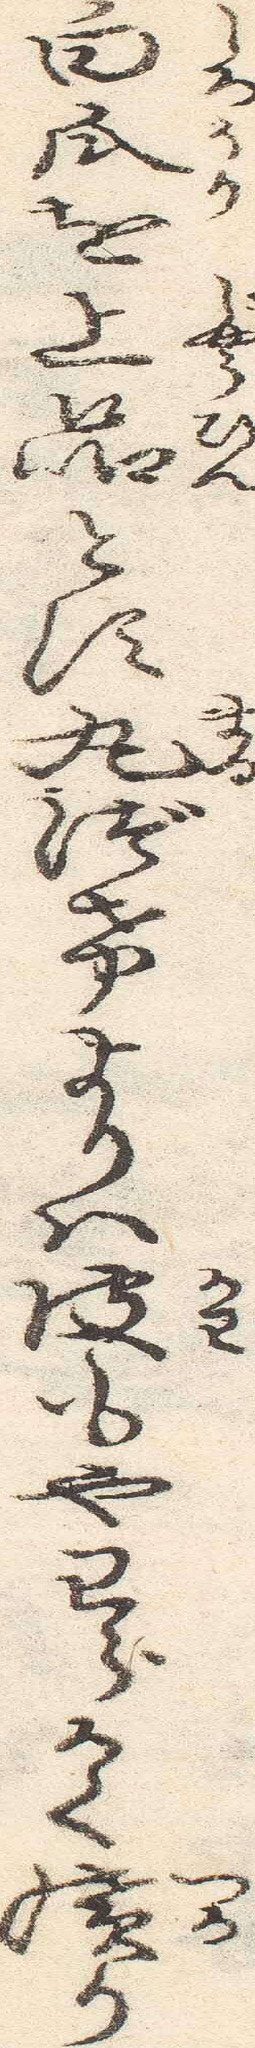白瓜を上品とす丸づけよりは皮もやわらかく漬り
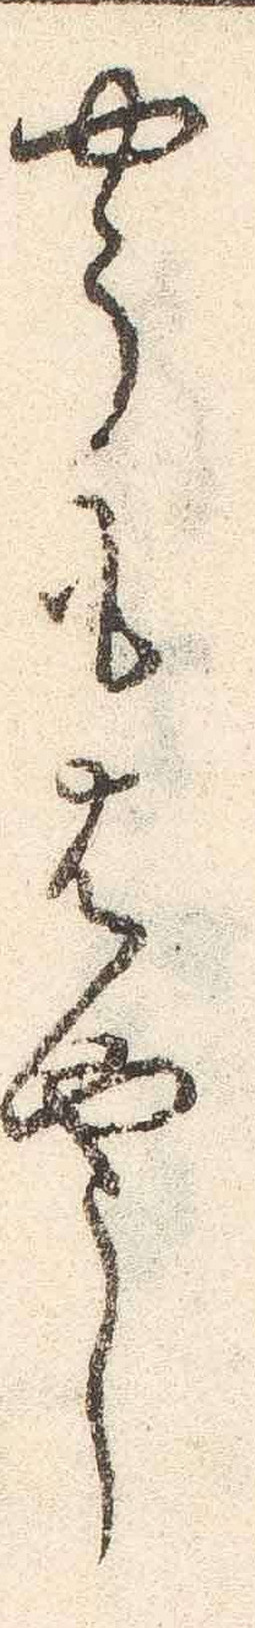やうもはやし
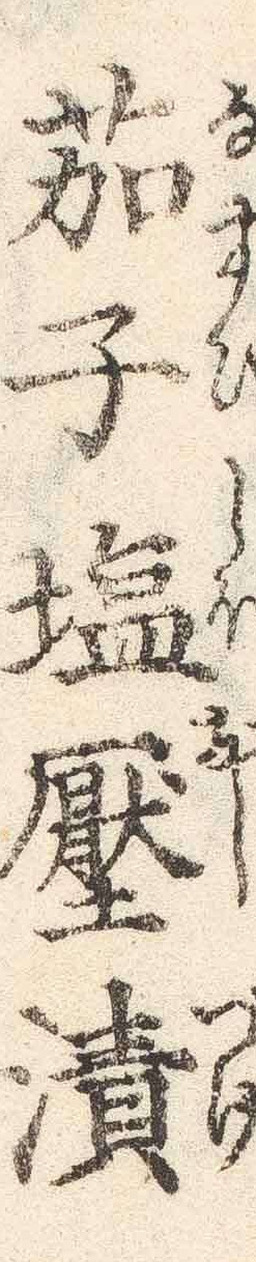茄子塩圧漬
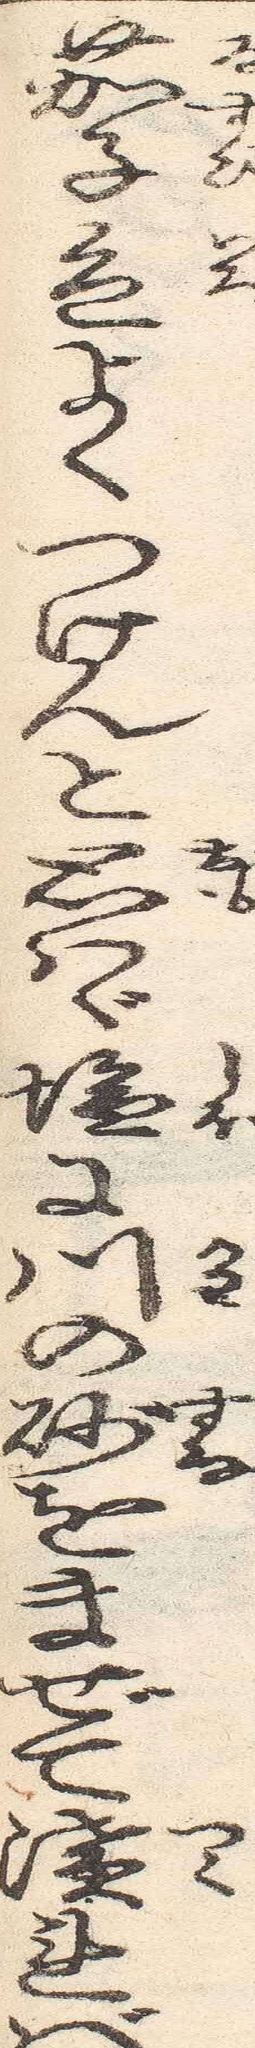茄子色よくつけんと思はゞ塩に川の砂をまぜて漬れば
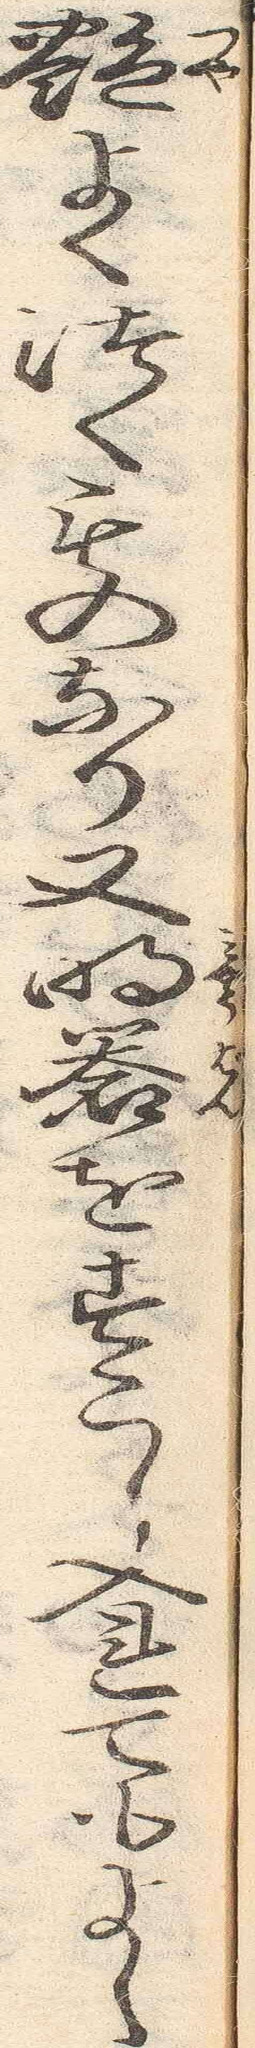艶よくつくものなり又明礬をすこし入れてもよし
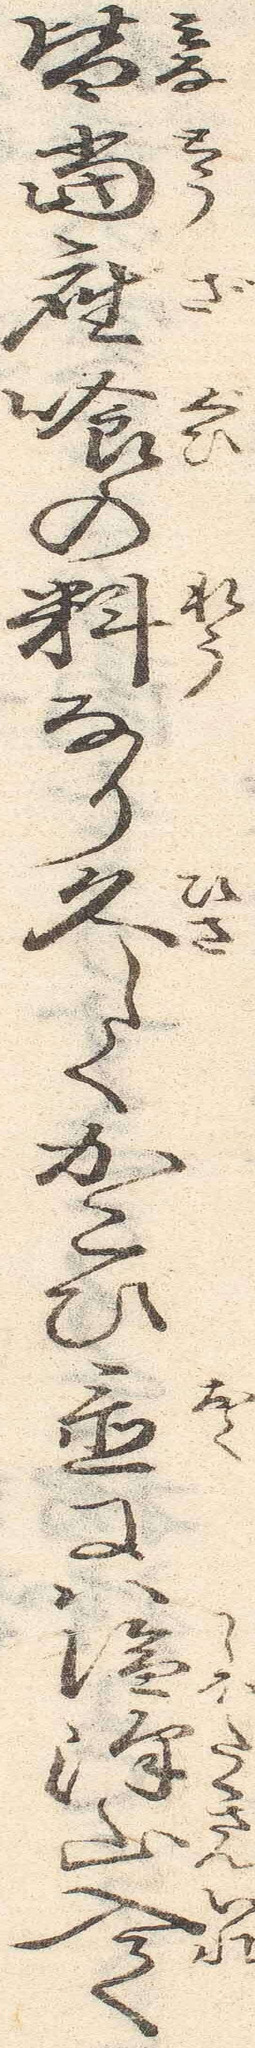皆当座喰の料なり久しくかこひ置には塩沢山入て
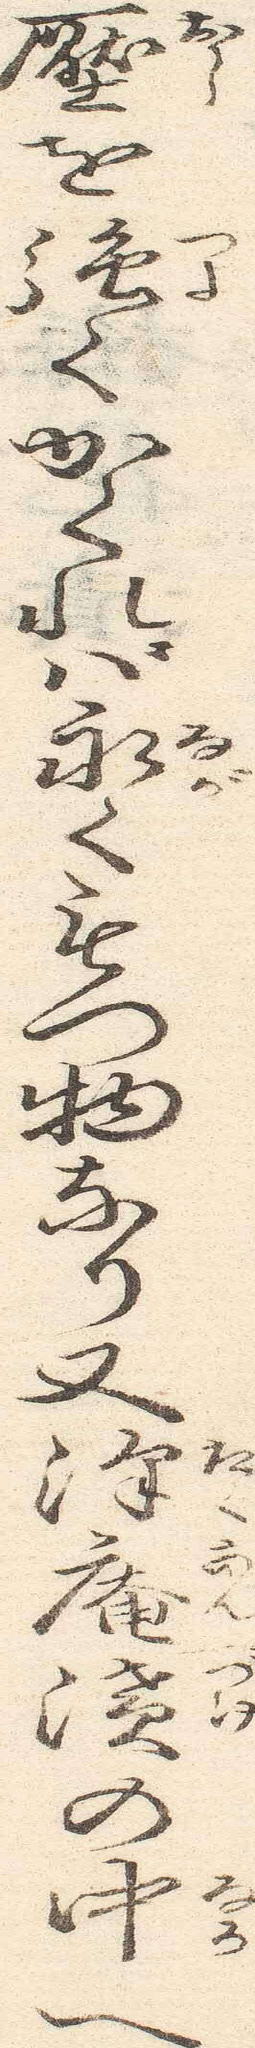圧を強くかくれば永くもつ物なり又沢庵漬の中へ
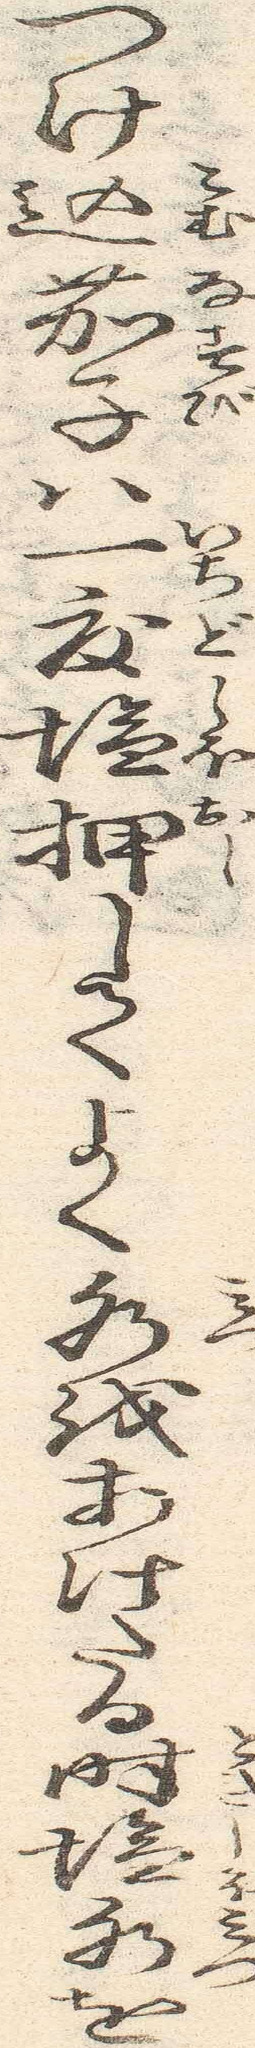つけ込茄子は一度塩押してよく水をあけたる時塩水を
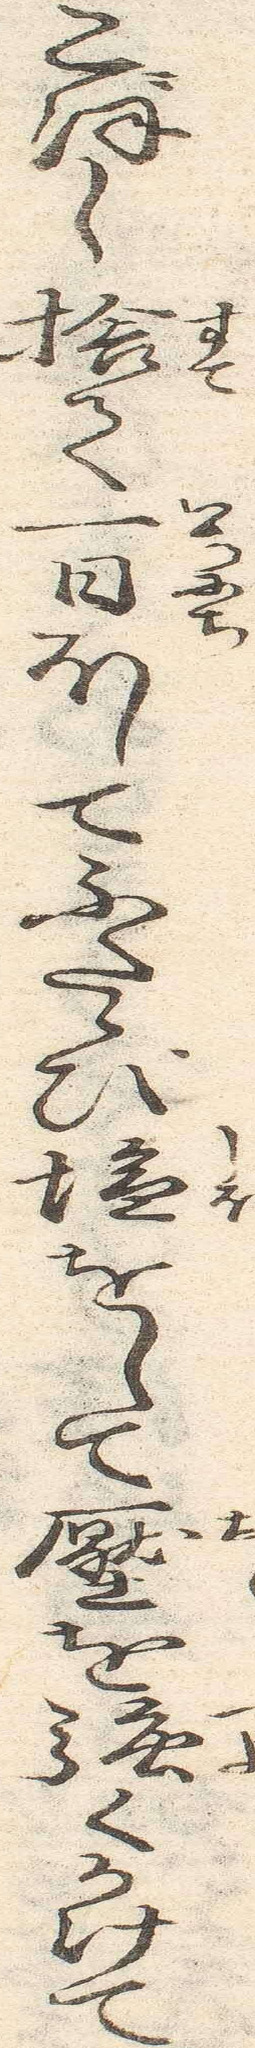こぼし捨て一日ほしてふたゝび塩をして圧を強くかけて
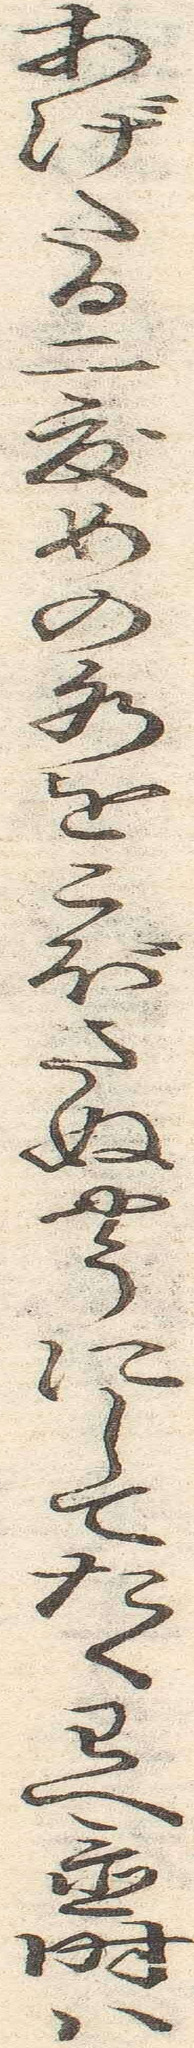あげたる二度めの水をこぼさぬやうにしてたくわへ置時は
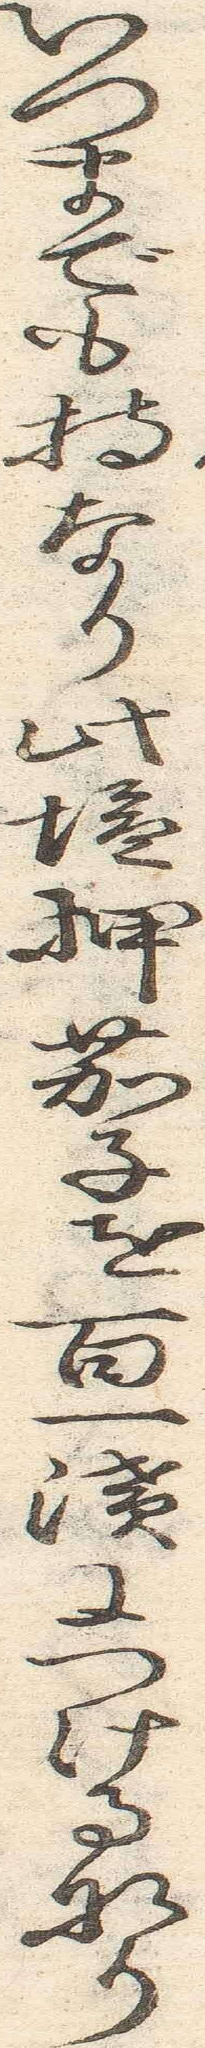いつまでも持つなり此塩押茄子を百一漬につけるなり
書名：四季漬物塩嘉言
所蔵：東京学芸大学附属図書館 国文学研究資料館
